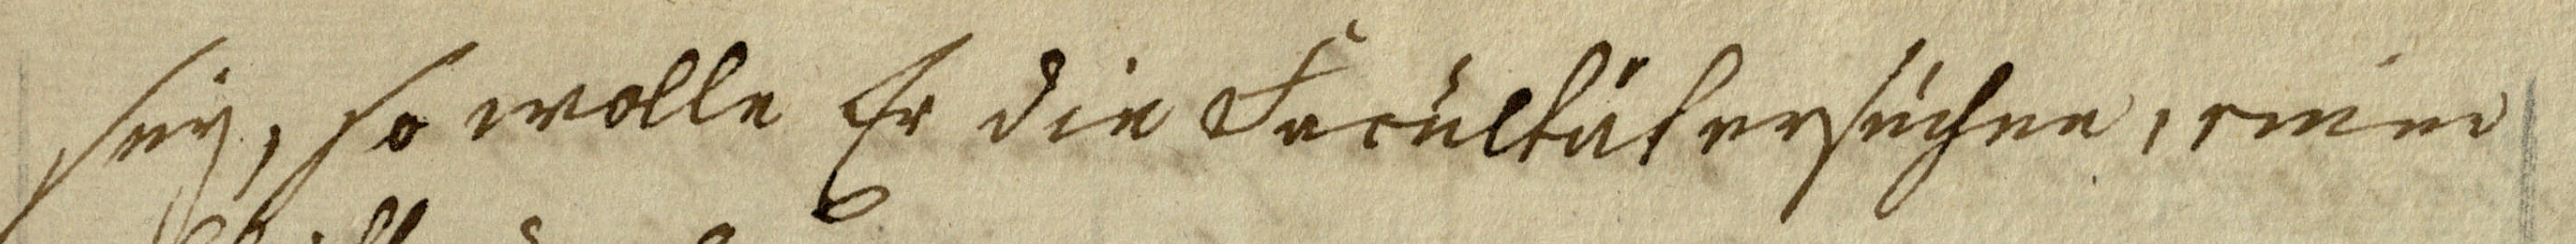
seÿ, so wolle Er die Facultät ersuchen, einen
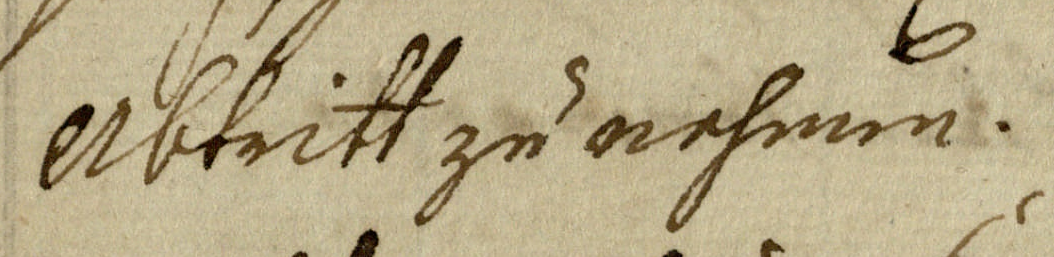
Abtritt zu nehmen.
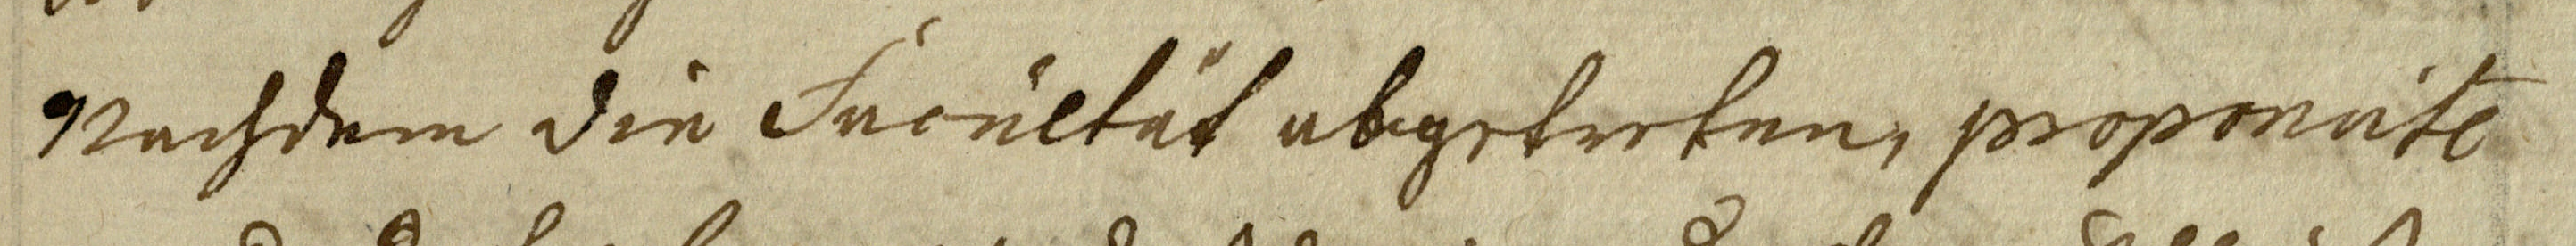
Nachdem die Facultät abgetreten, proponirte
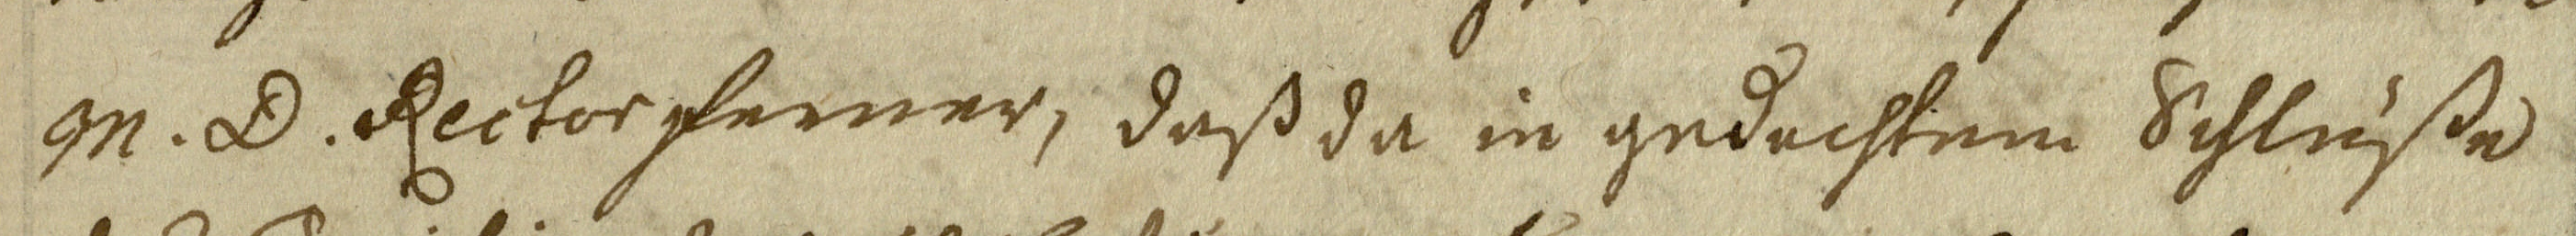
M. D. Rector ferner, daß da in m Schluße
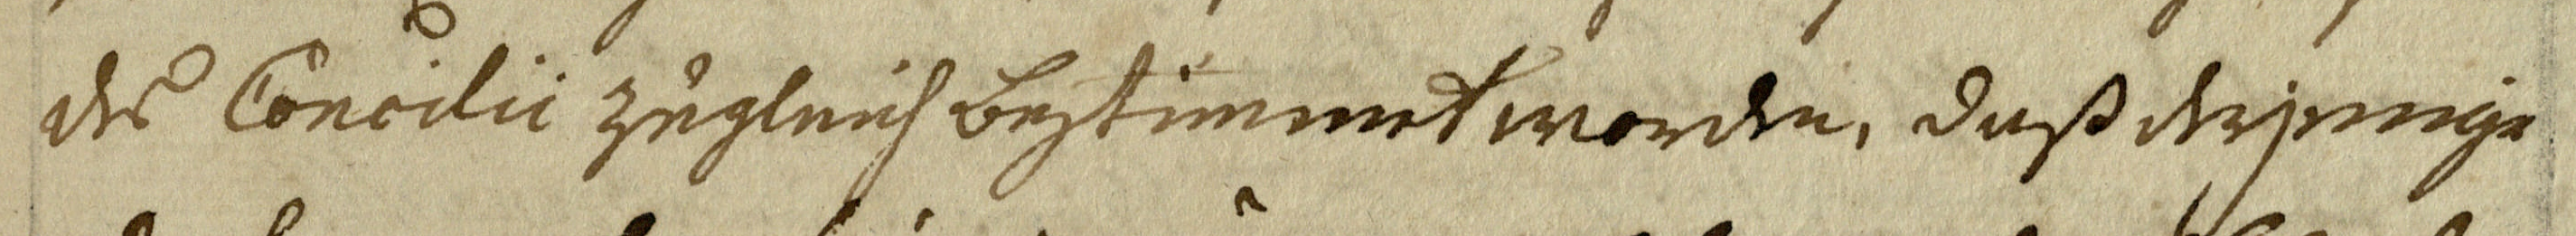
des Concilii zugleich bestimmet worden, daß derjenige
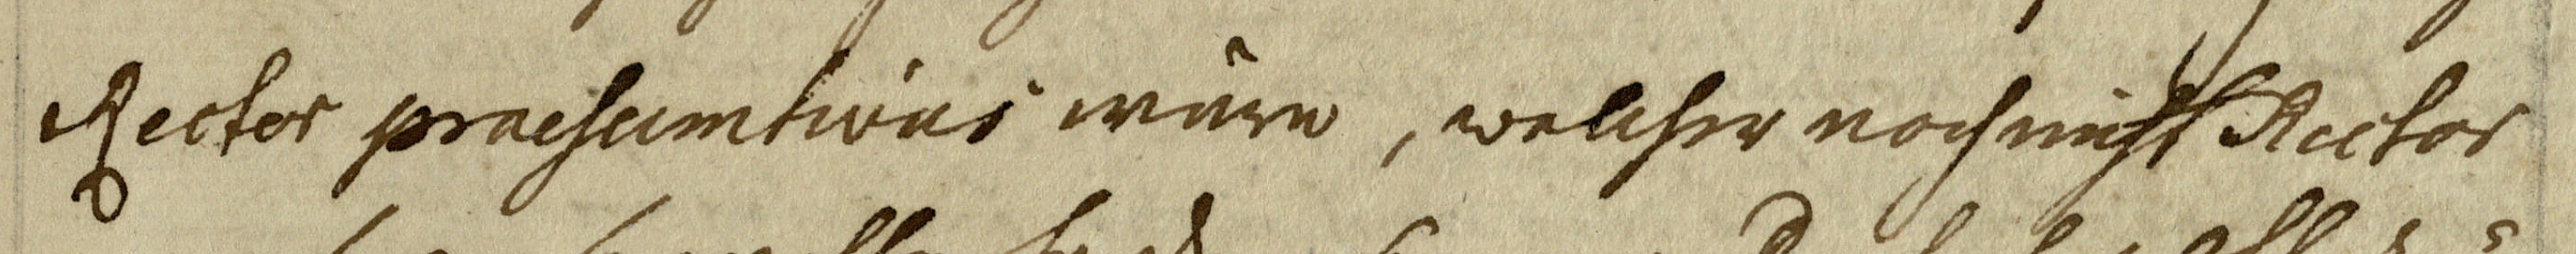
Rector praesumtivus wäre, welcher nochnicht Rector
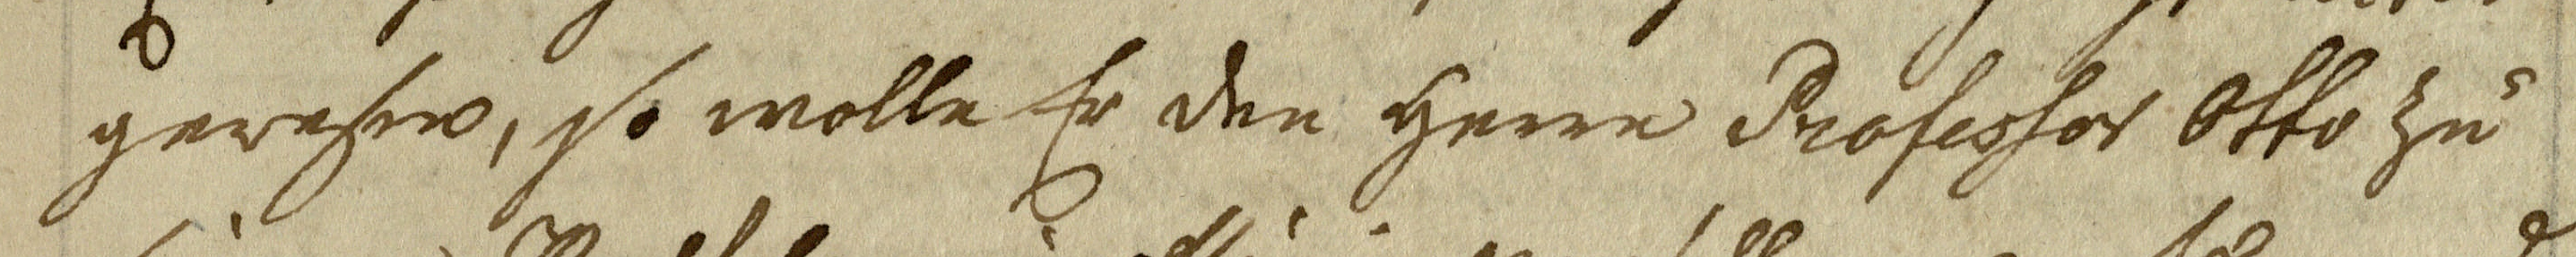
gewesen, so wolle Er den Herrn Professor Otto zu
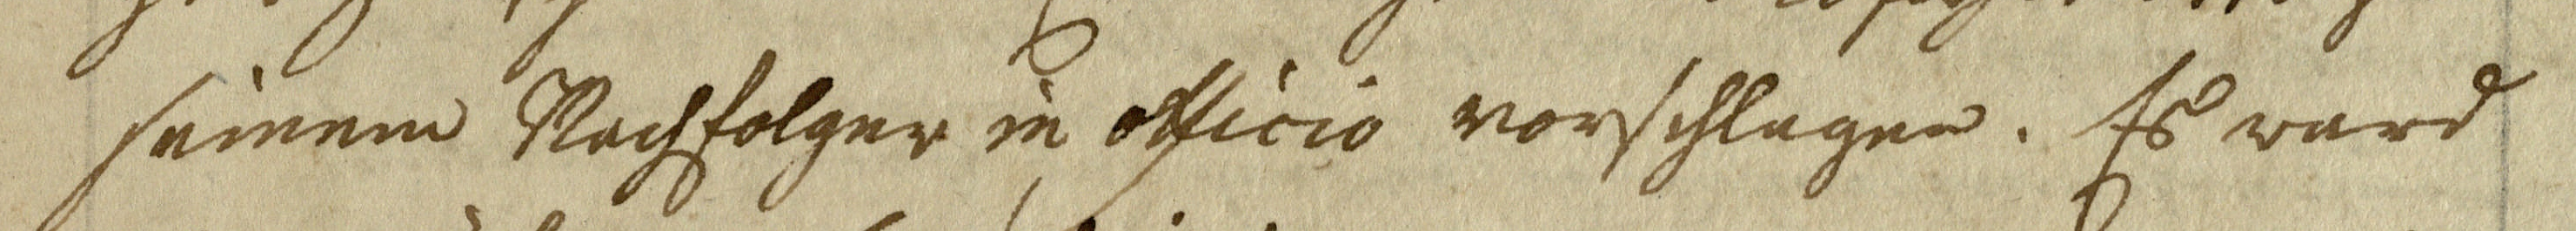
seinem Nachfolger in officio vorschlagen. Es ward
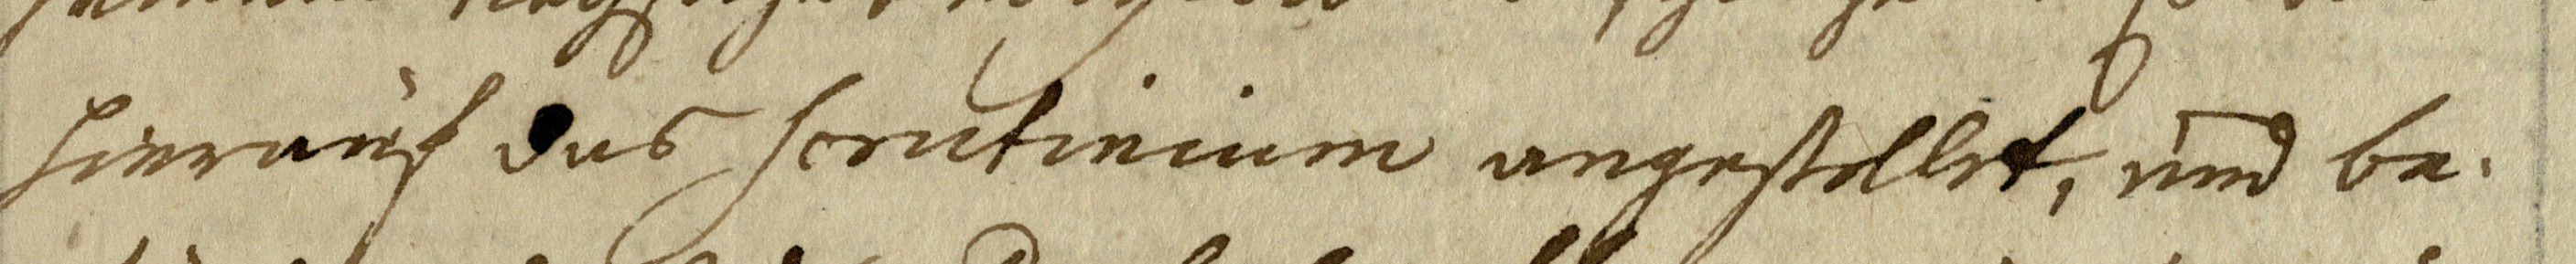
hierauf das scrutinium angestellet und be¬
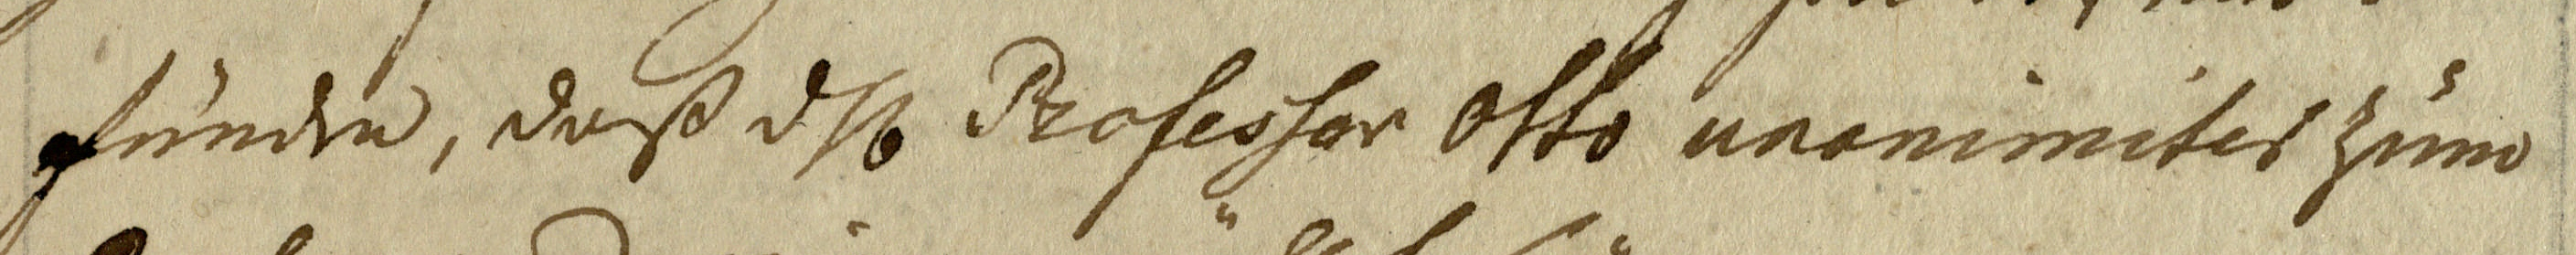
funden, daß dh Professor Otto unonimiter zum
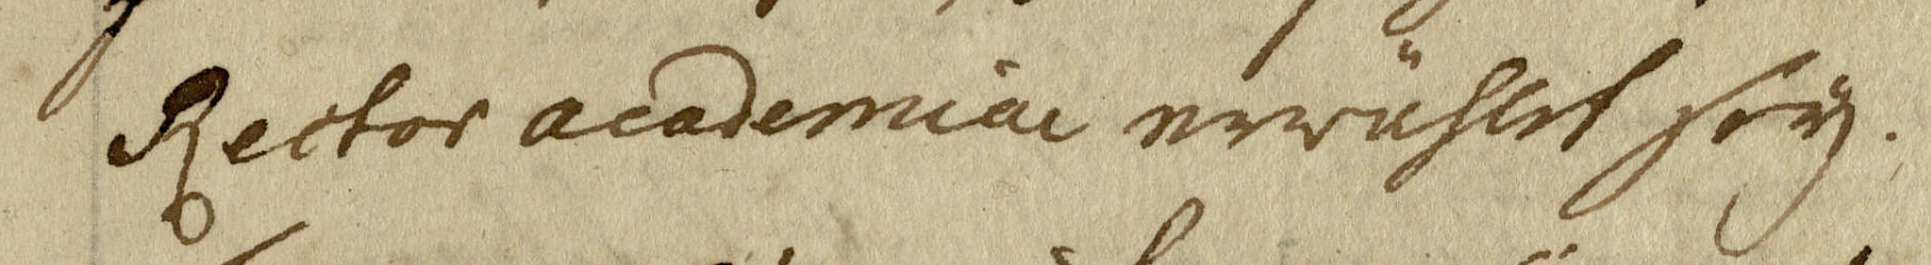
Rector Academiae erwählet seÿ.
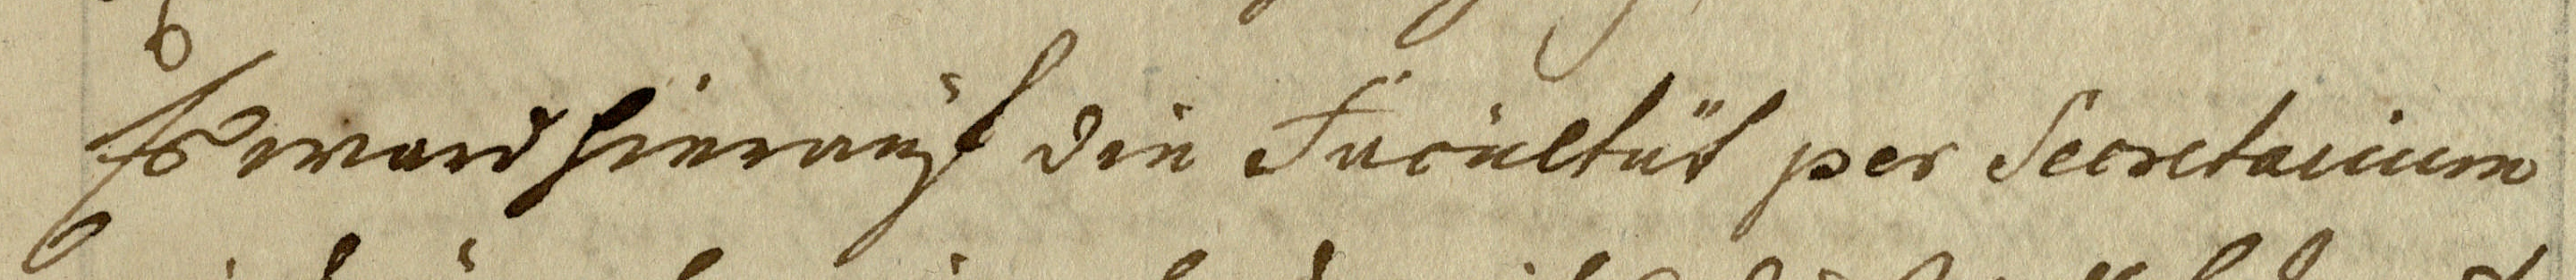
Es ward hierauf die Facultät per Secretarium
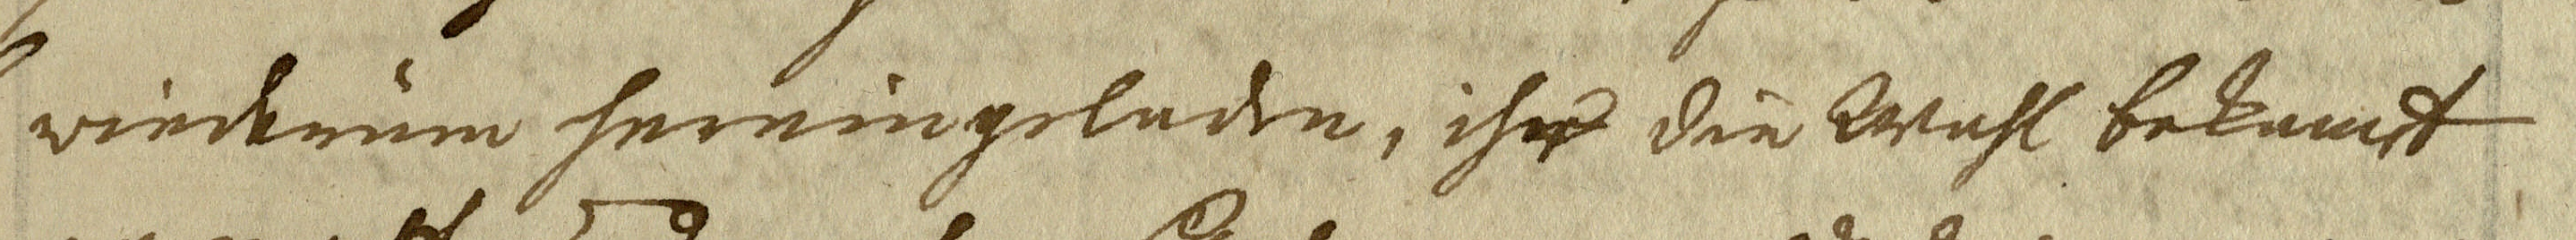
wiederum hereingeladen, ihr die Wahl bekannt
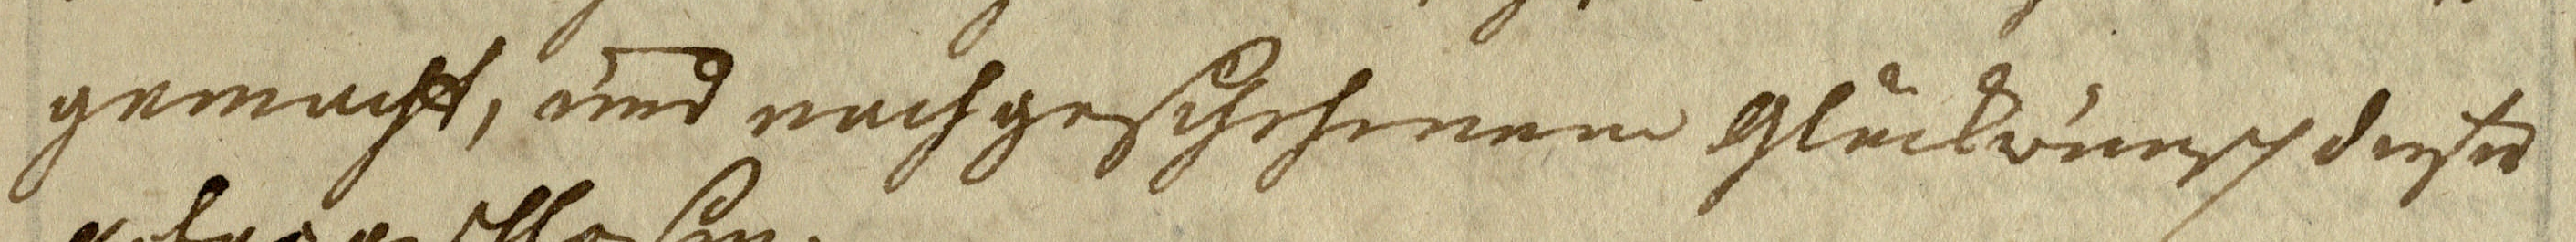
gemacht, und nach geschehenem Glückwunsch dieser
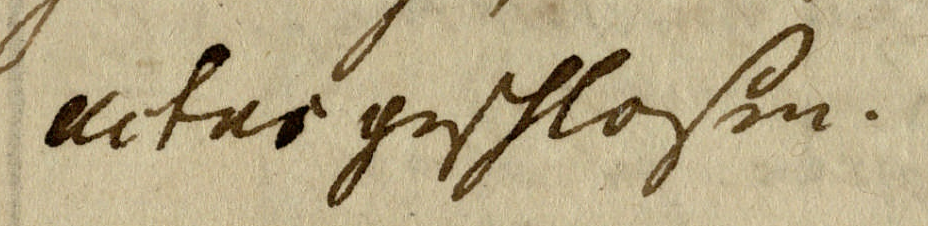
Actus geschloßen.
